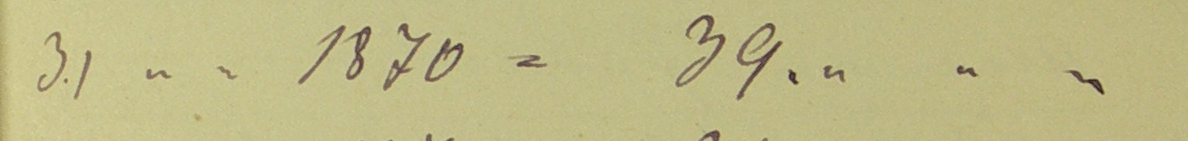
3) * 1870 = 39 *
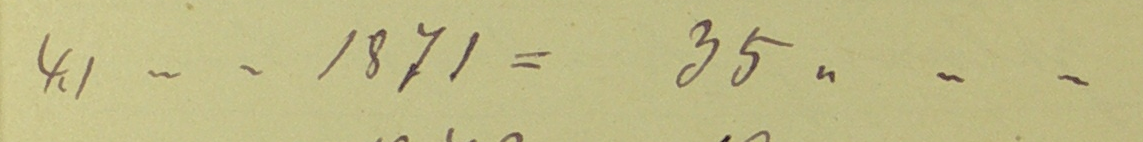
4) * 1871 = 35 *
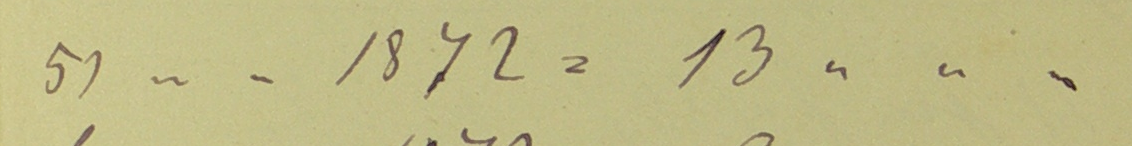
5) * 1872 = 13 *
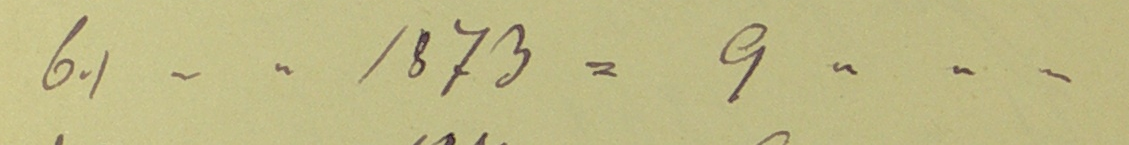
6) * 1873 = 9 *
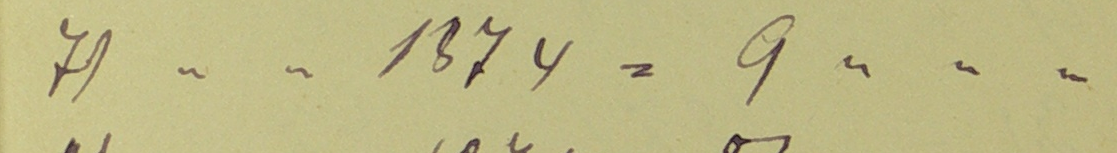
7) * 1874 = 9 *
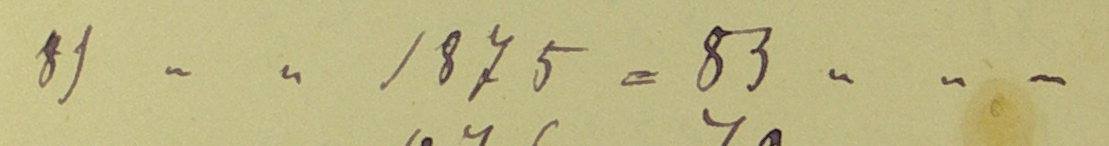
8) * 1875 = 83 *
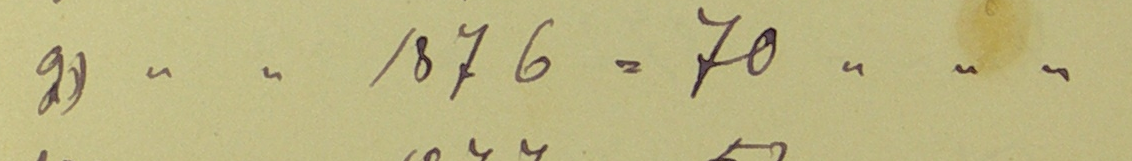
9) * 1876 = 70 *
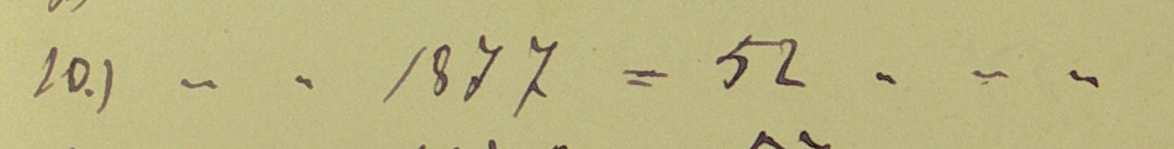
10) * 1877 = 52 *
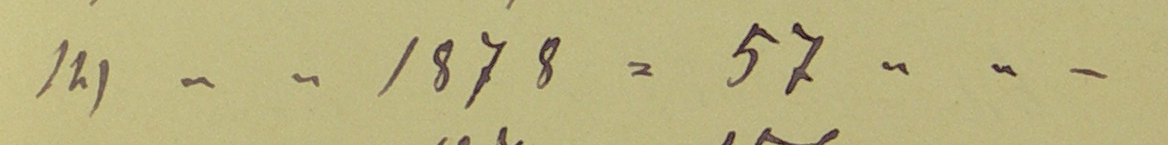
11) * 1878 = 57 *
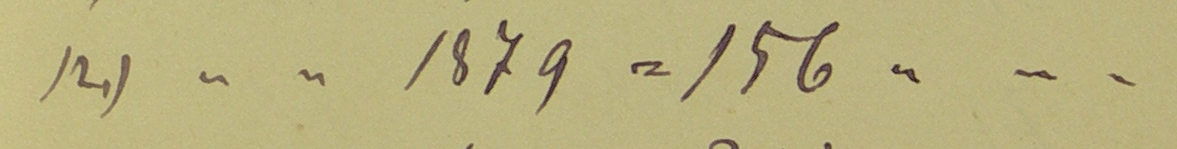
12) * 1879 = 156 *
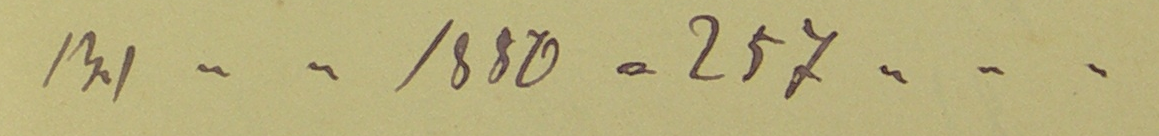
13) * 1880 = 257 *
